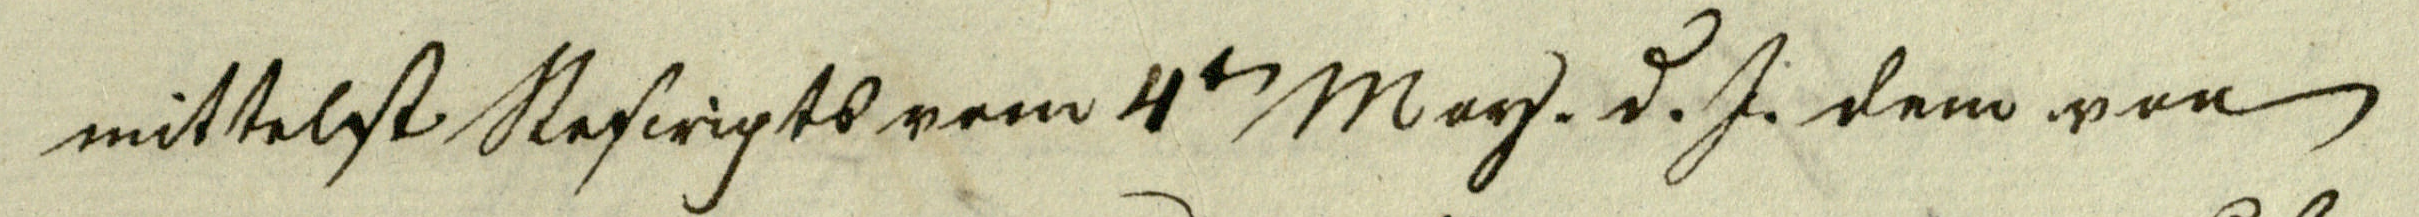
mittlest Rescripts vom 4ten May. d. J. dem von
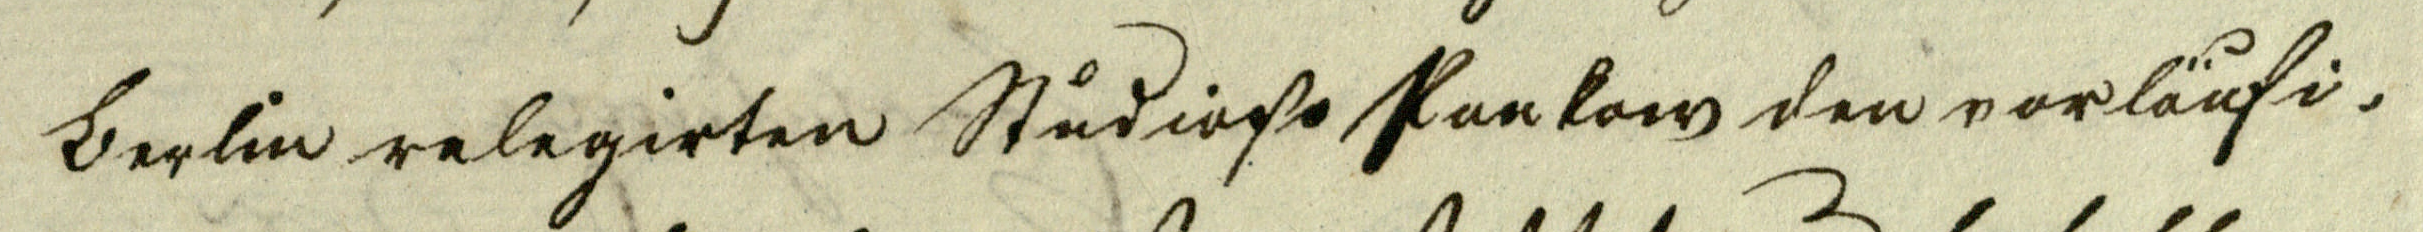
Berlin relegirten Studioso Pankow den vorläufi¬
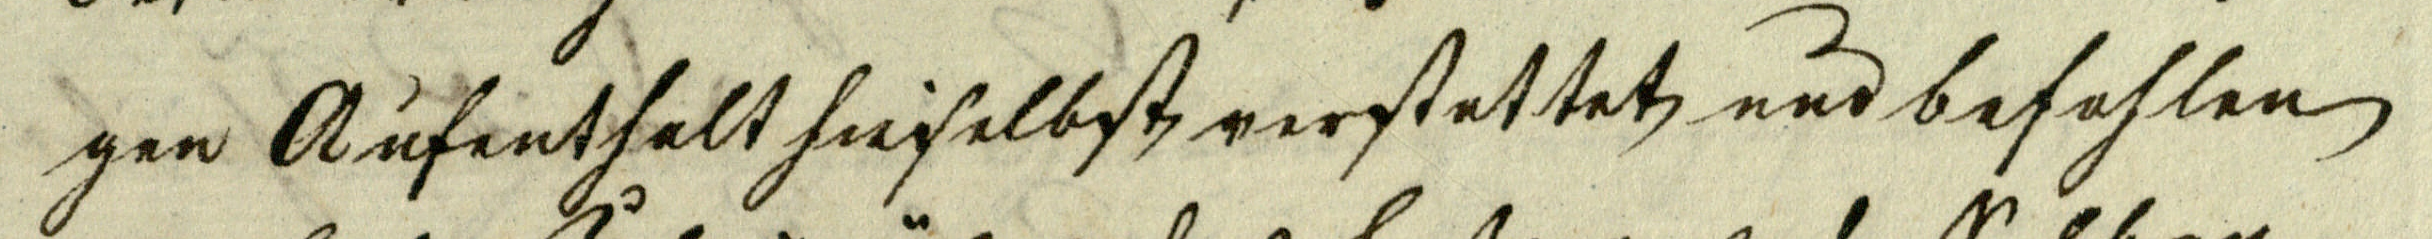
gen Aufenthalt hieselbst verstattet und befohlen
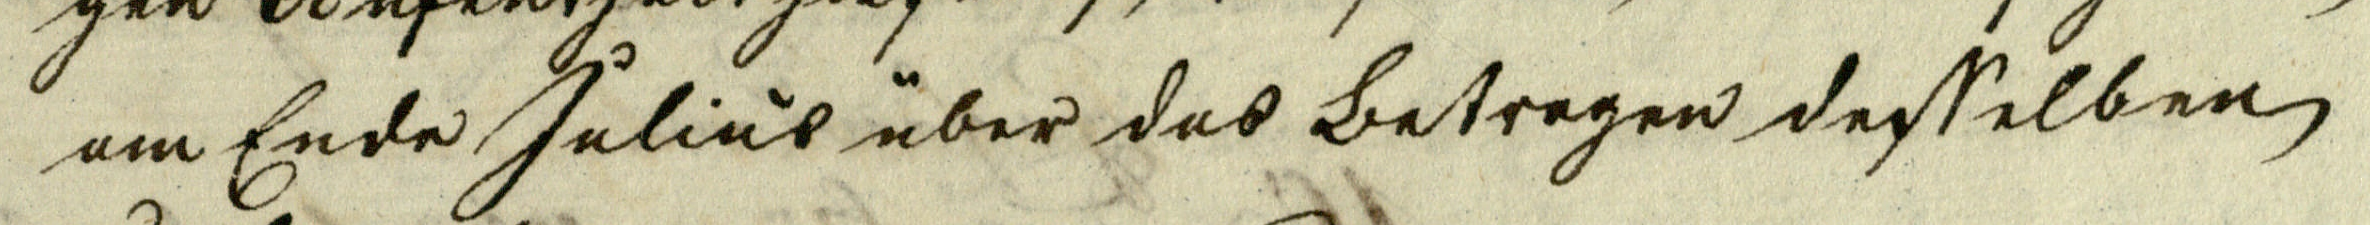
am Ende Julius über das Betragen desselben
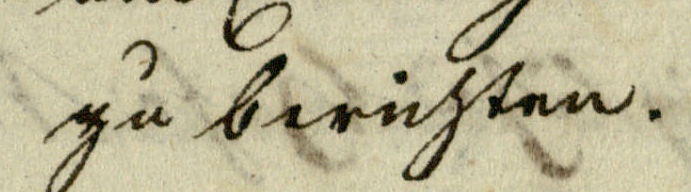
zu berichten.
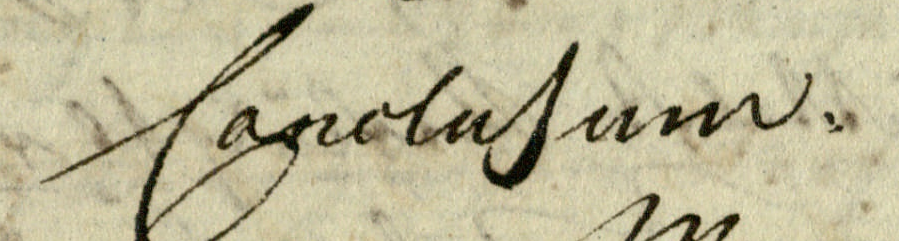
Conclusum:
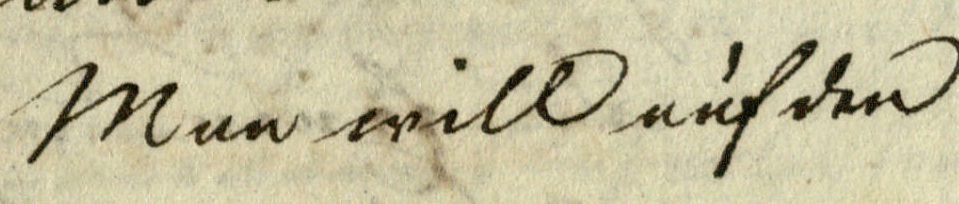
Man will auf den
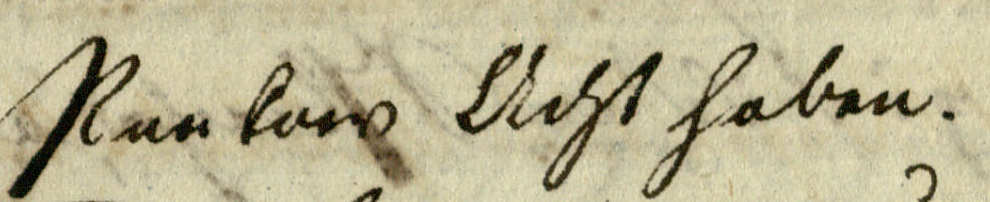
Pankow Acht haben.
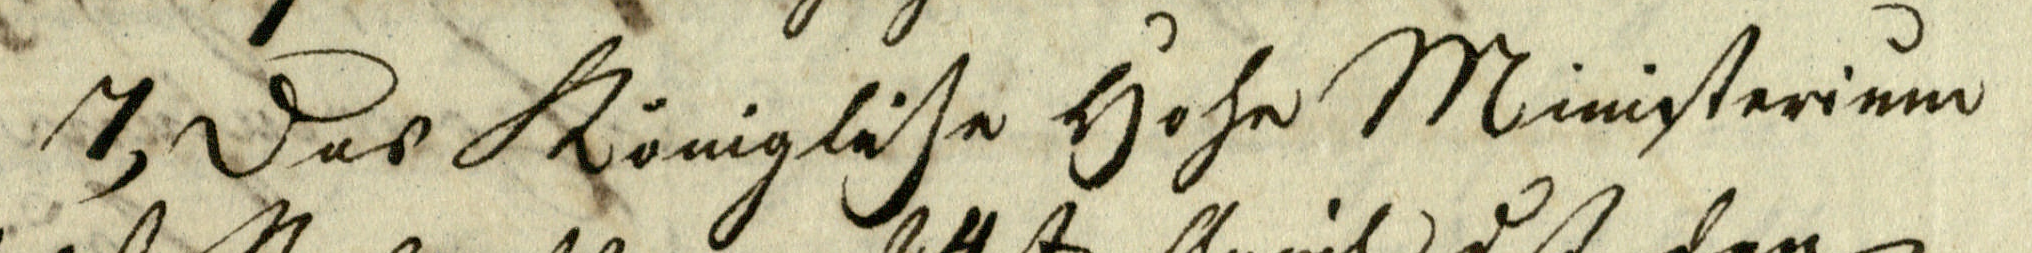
7, Das Königliche Hohe Ministerium
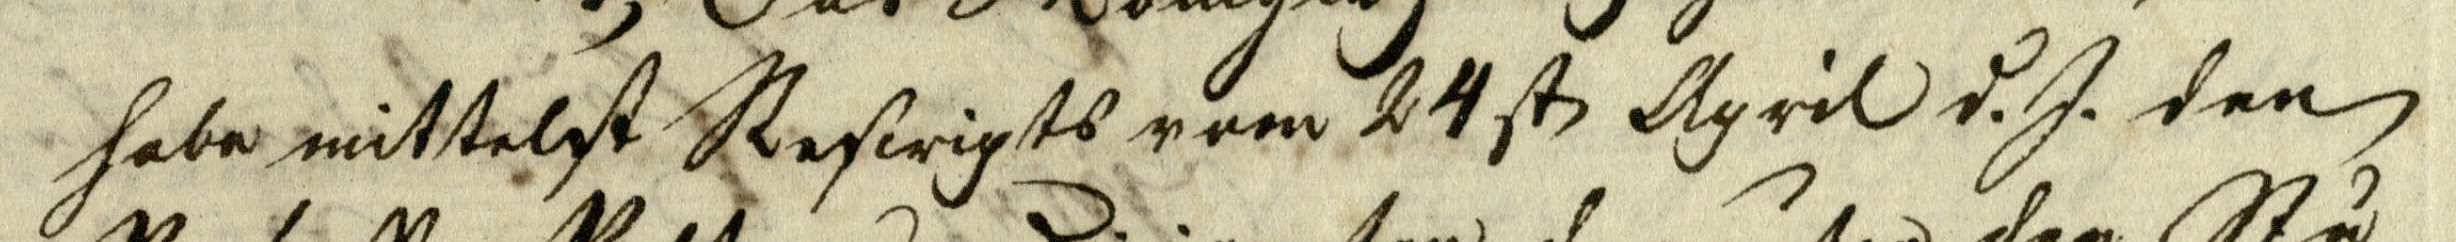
habe mittelst Rescripts vom 24 sten April d. J. den
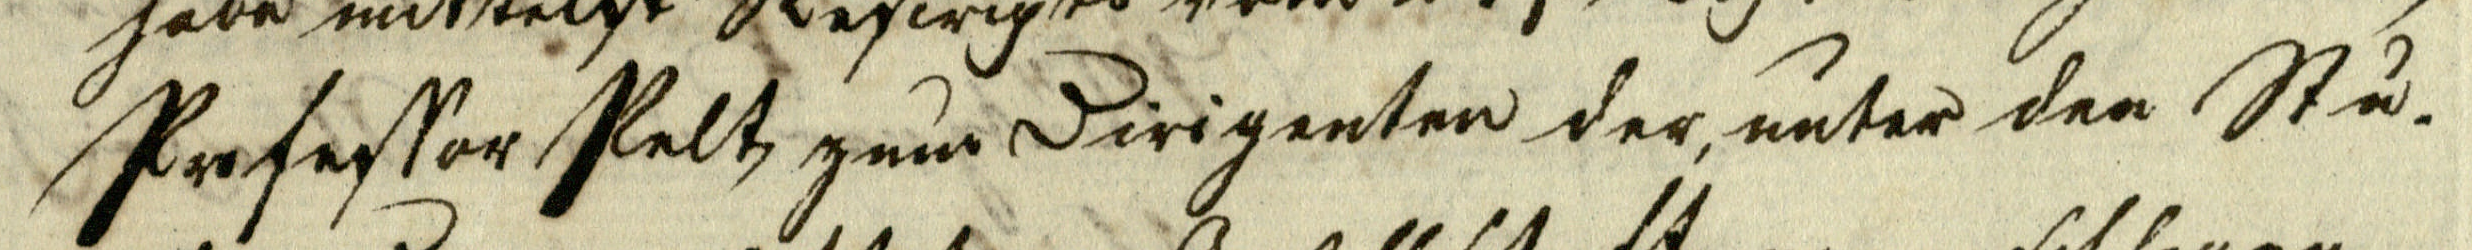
Professor Pelt zum Dirigenten der, unter den Stu¬
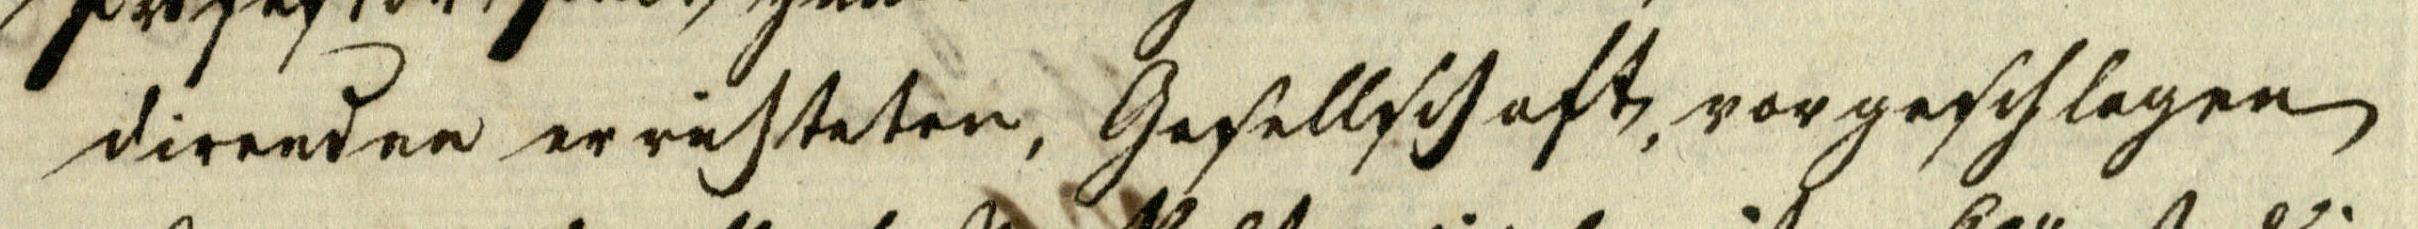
direnden errichteten, Gesellschaft, vorgeschlagen
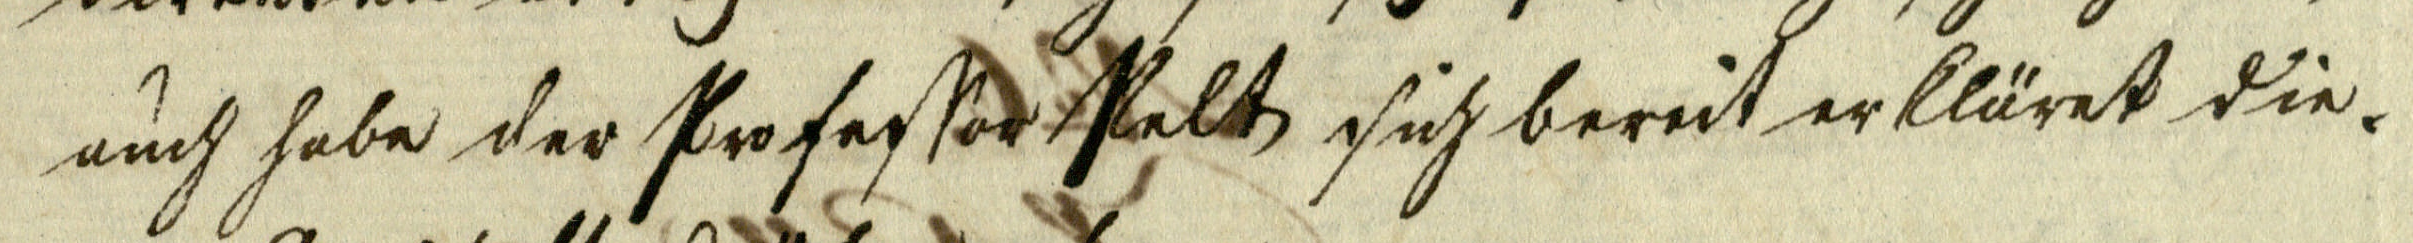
auch habe der Professor Pelt sich bereit erkläret die¬
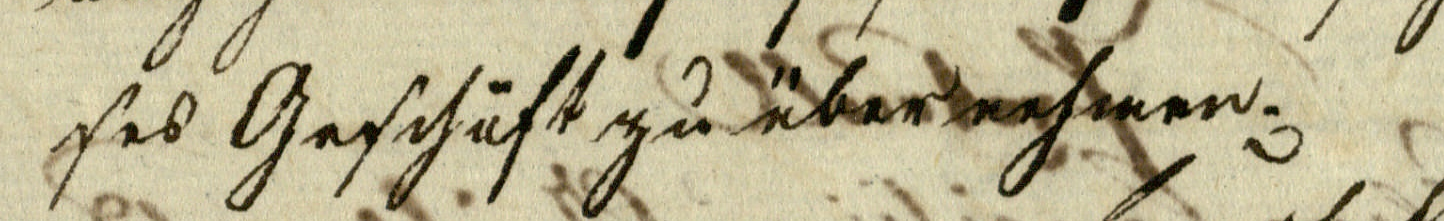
ses Geschäft zu übernehmen.
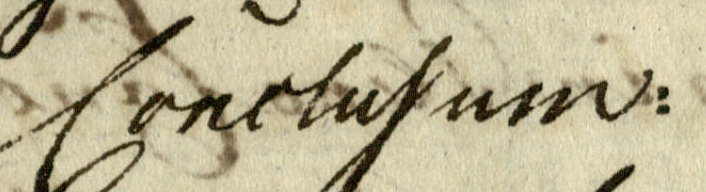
Conclusum:
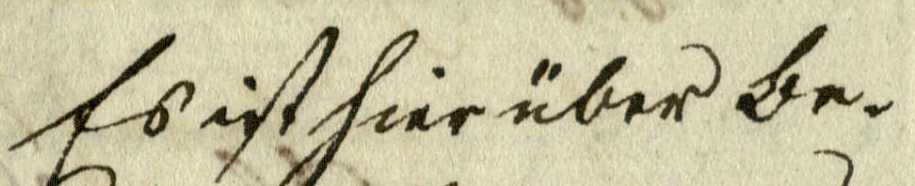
Es ist hierüber Be¬
